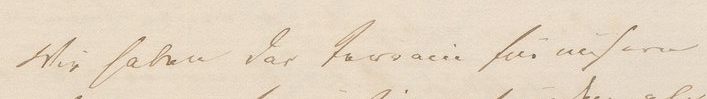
Wir haben das Terrain für unsern
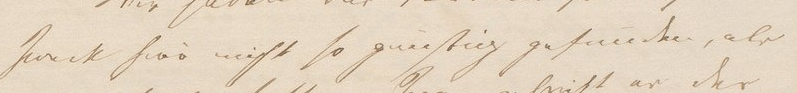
Zweck hier nicht so günstig gefunden, als
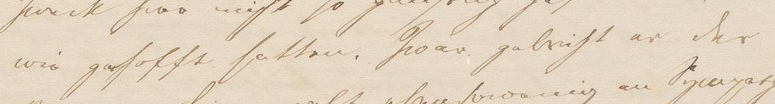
wir gehofft hatten. Zwar gebricht es der
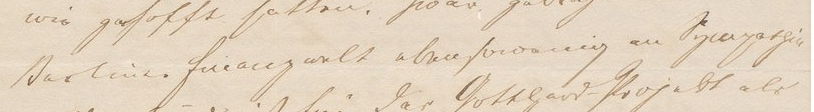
Berliner Finanzwelt ebensowenig an Sympathie
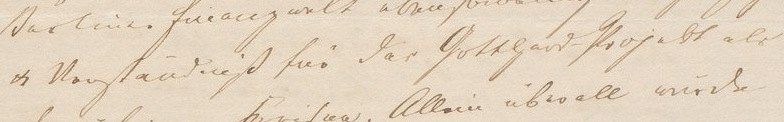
& Verständniß für das Gotthard-Projekt als
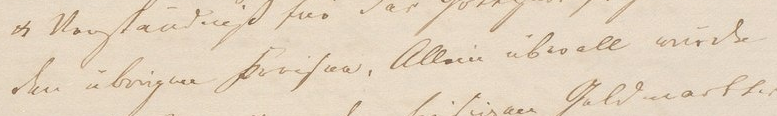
den übrigen Kreisen. Allein überall wurde
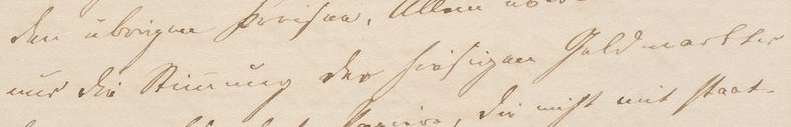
uns die Stimmung des hiesigen Geldmarktes
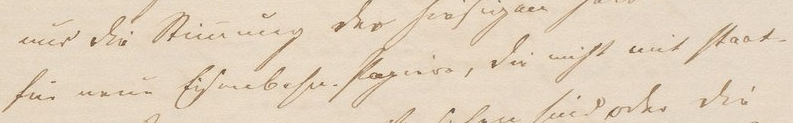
für neue Eisenbahn-Papiere, die nicht mit staat-
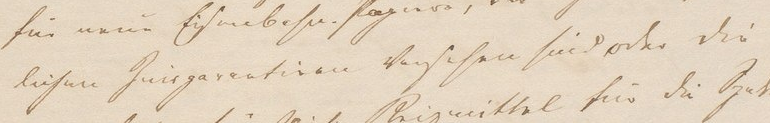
lichen Zinsgarantien versehen oder die
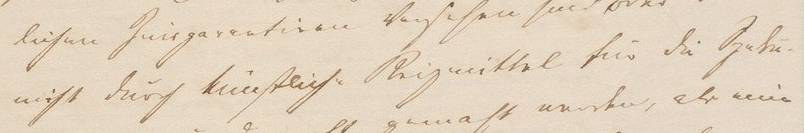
nicht durch künstliche Reizmittel für die Speku-
